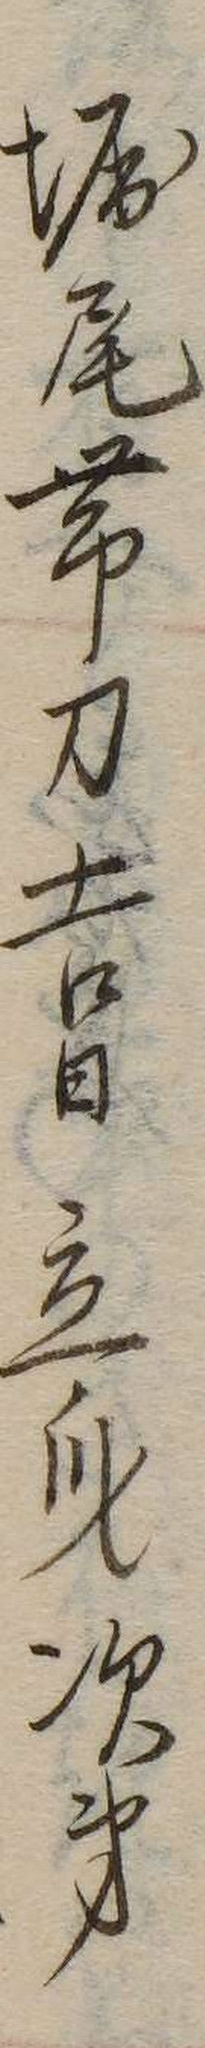堀尾帯刀吉日立身次第
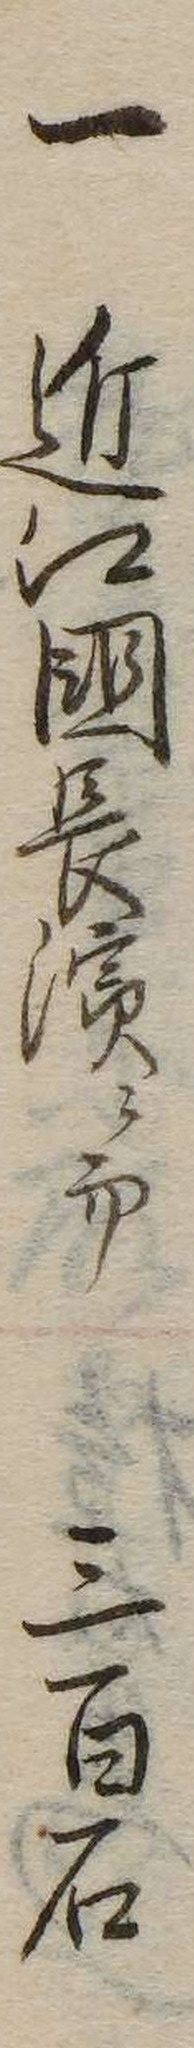一近江国長浜ニ而三百石
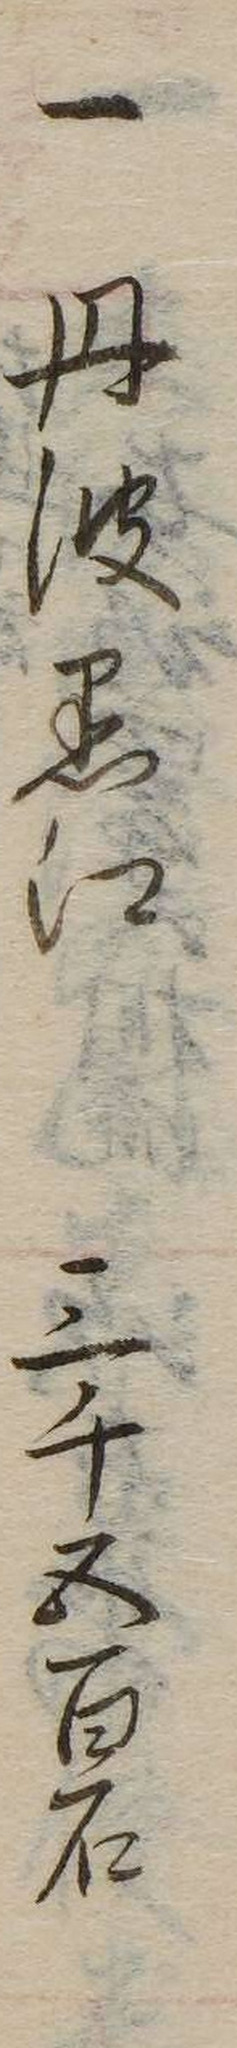一丹波黒江三千五百石
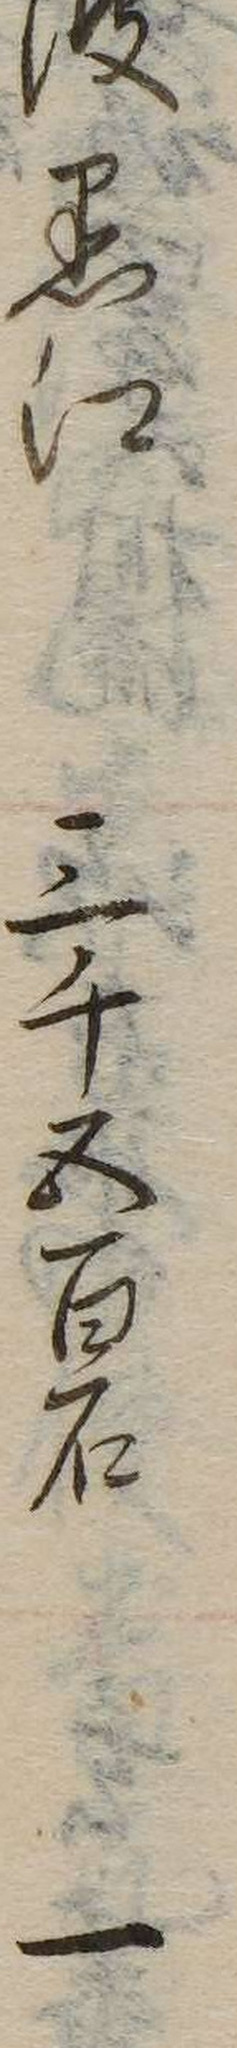一丹波黒江三千五百石
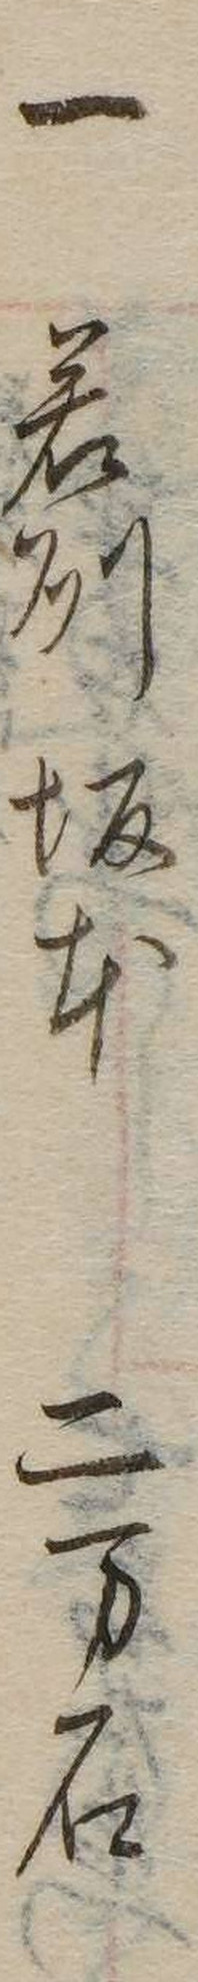一若州坂本二万石
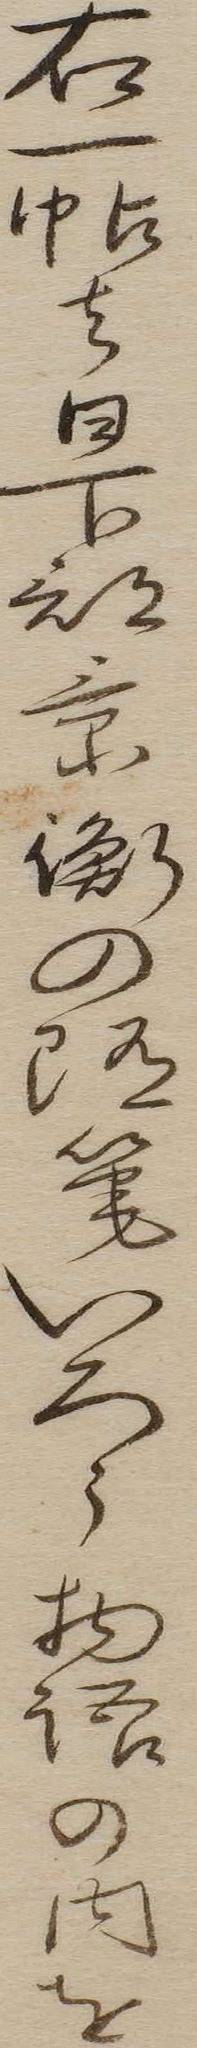右一帖は日下部景衡の随筆いろう物語の内を
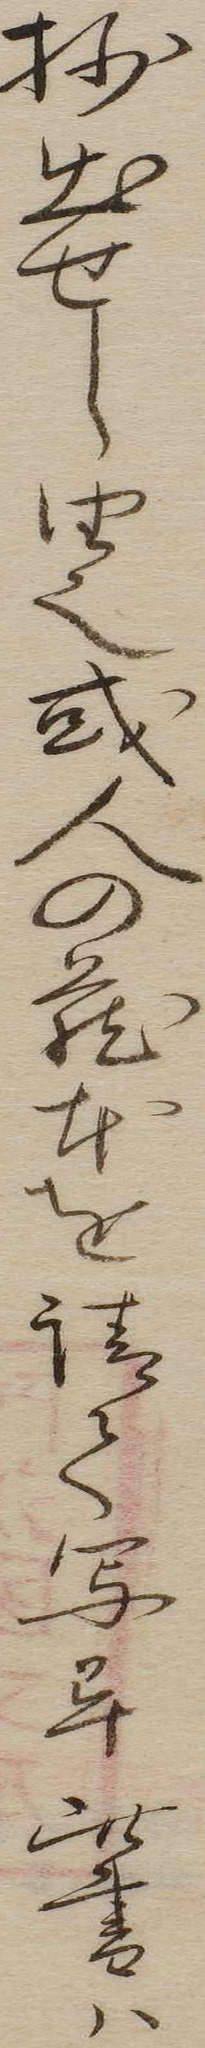抄出せし由也或人の蔵本を請て写畢此書は
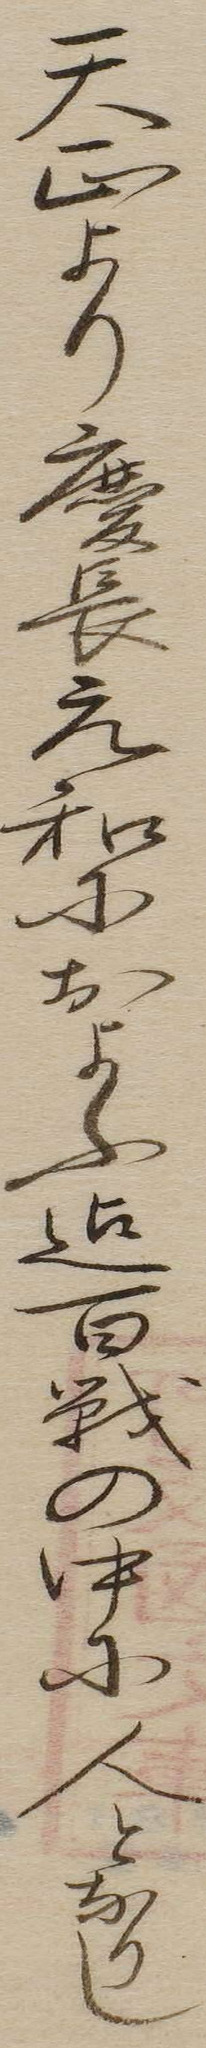天正より慶長元和におよふ迄百戦の中に人となりし
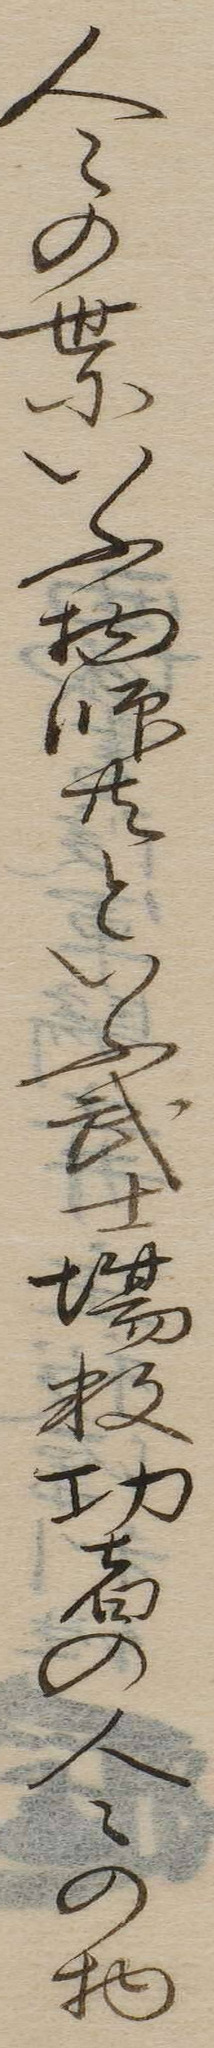人々の世にいふ物師共といふ武士場数功者の人々の物
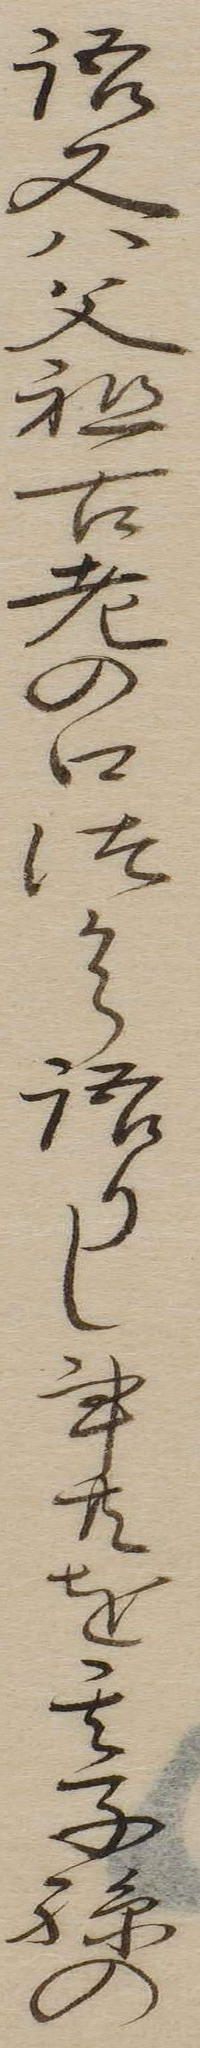語又は父祖古老の口つから語りし事共を其子孫の
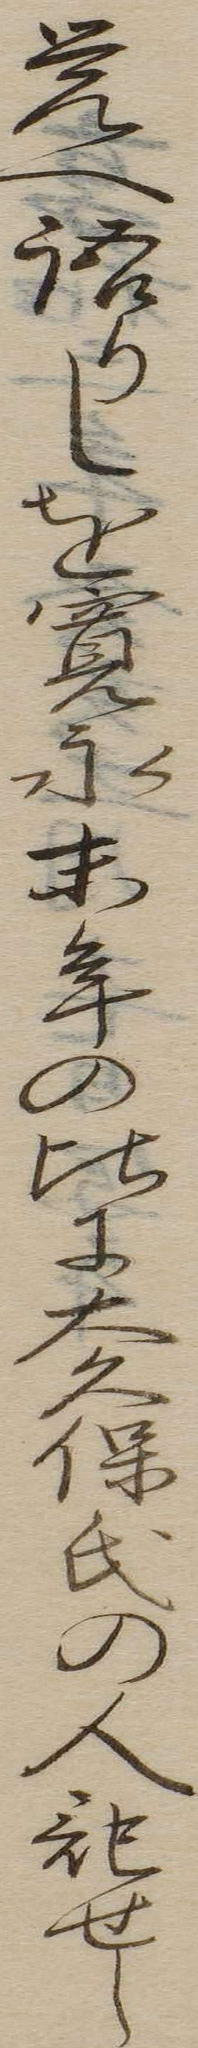覚へ語りしを寛永末年の頃に大久保氏の人記せし
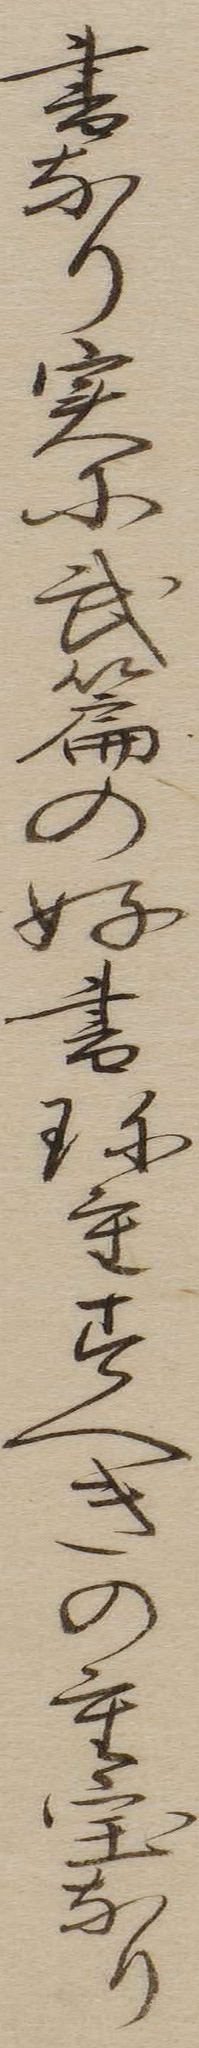書なり実に武篇の好書珍重すへきの重宝なり
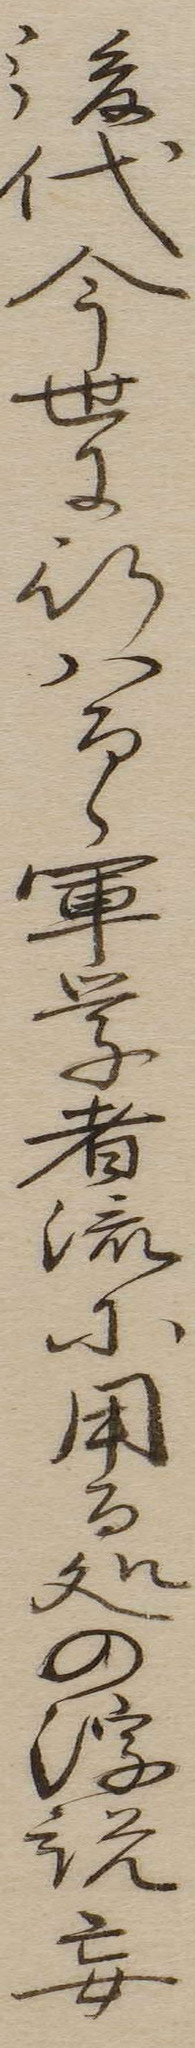後代今世に行はるゝ軍学者流に用る処の浮説妄
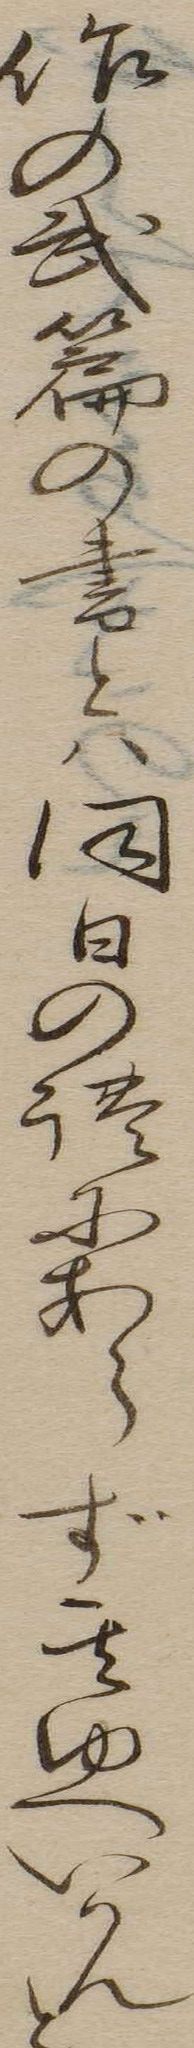作の武篇の書とは同日の談にあらず其ゆへいかんと
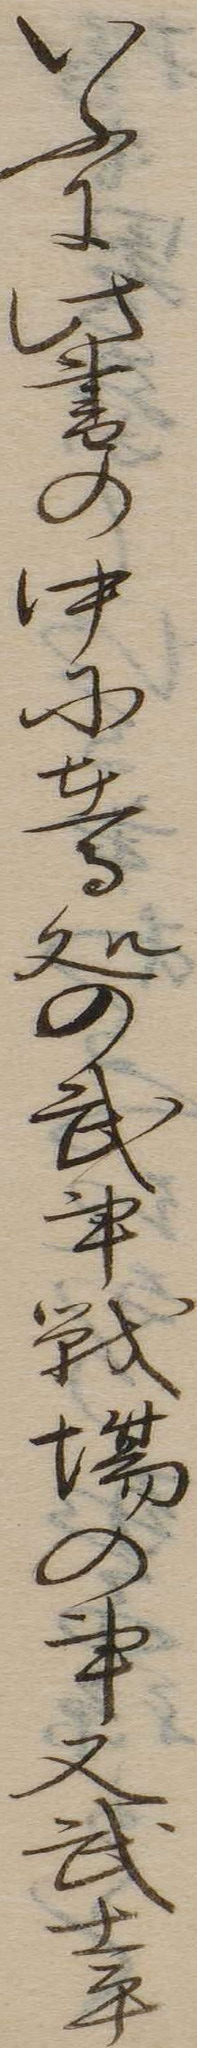いふに此書の中に在る処の武事戦場の事又武士平
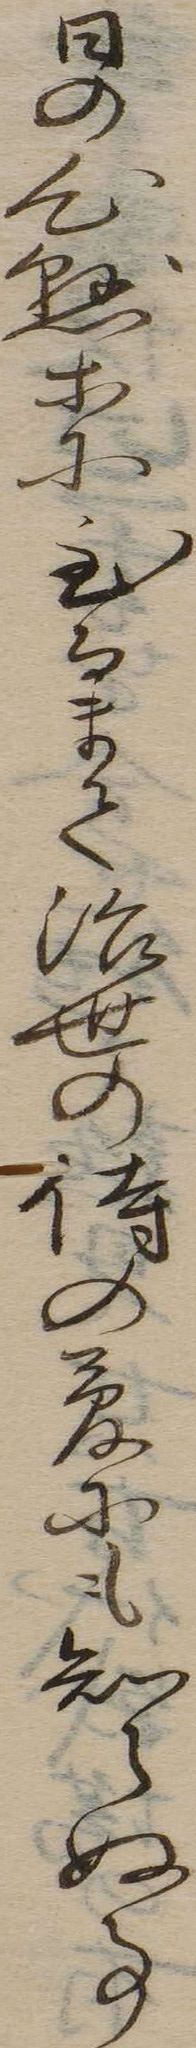日の心懸等に到るまて治世の侍の夢にも知らぬ事
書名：三河之物語
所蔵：国文学研究資料館
